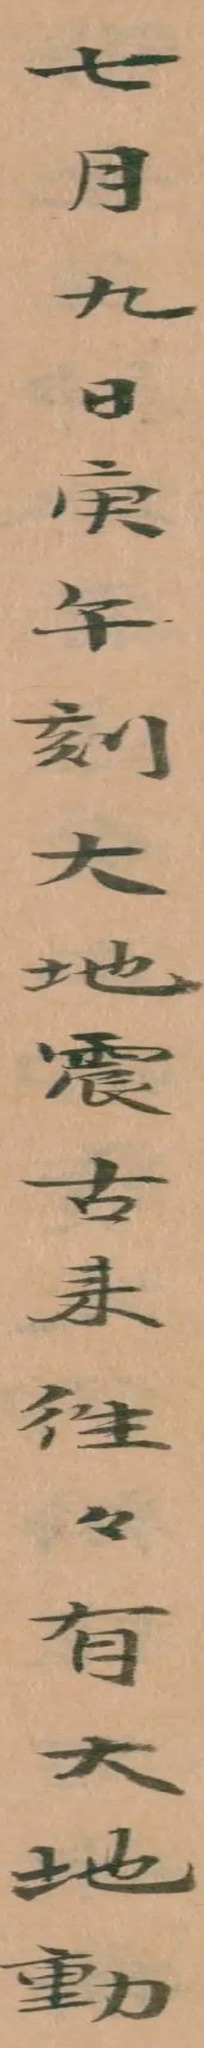七月九日庚午刻大地震古来往々有大地動
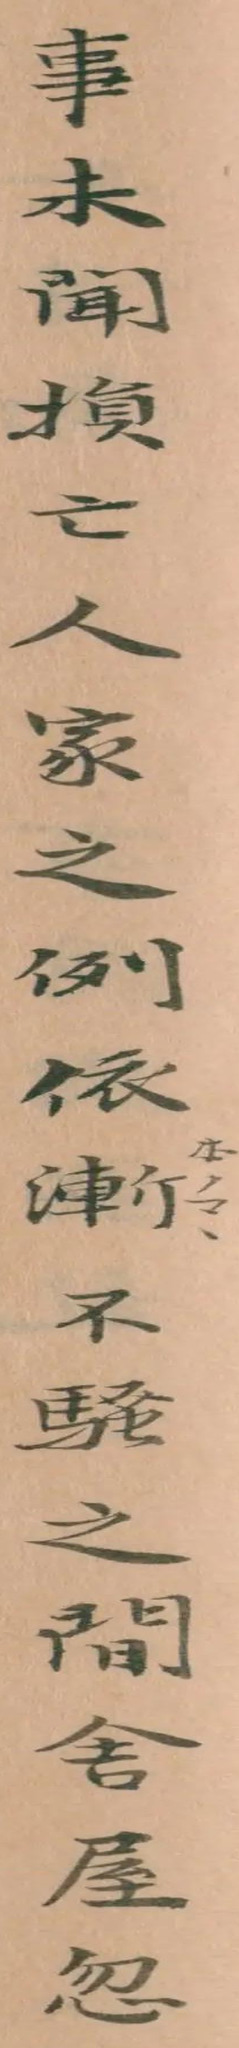事未聞損亡人家之例依漸不騒之間舎屋忽
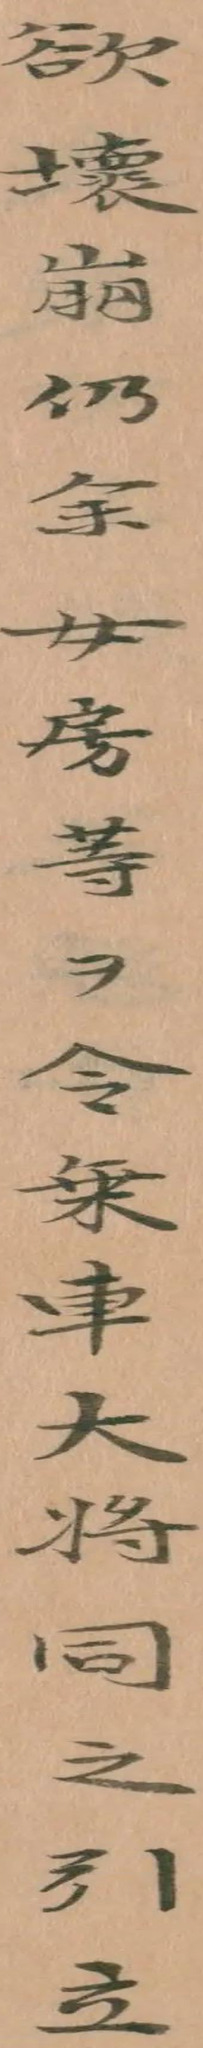欲壊崩仍余女房等ヲ今乗車大将同之引立
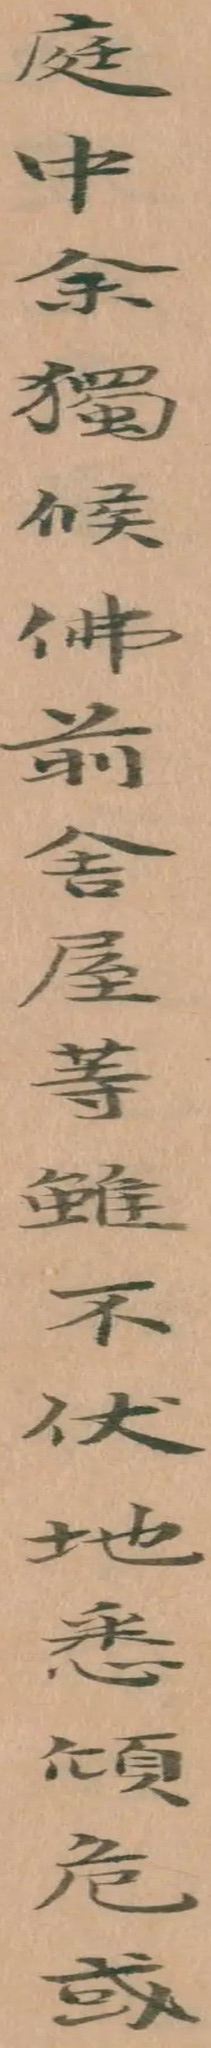庭中余独候仏前舎屋等雖不伏地悉傾危或
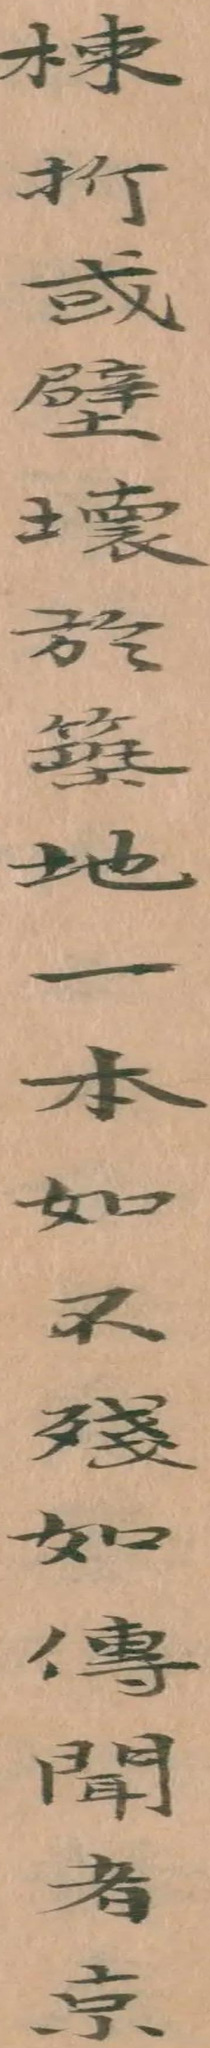棟折或壁壊於築地一本如不残如伝聞者京
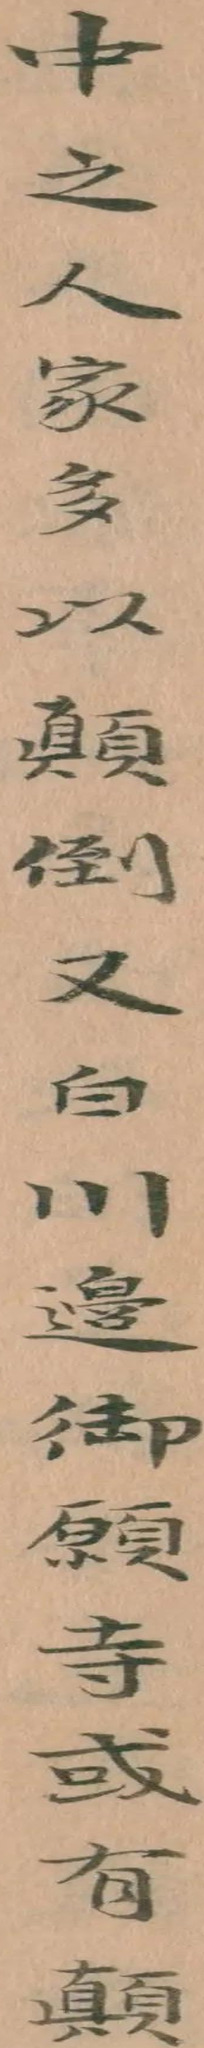中之人家多以顛倒又白川辺御願寺或有顛
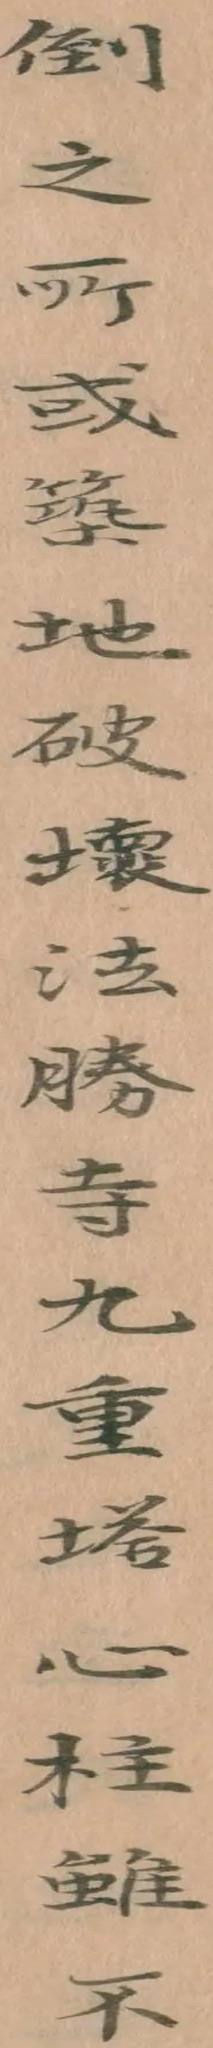倒之所或築地破壊法勝寺九重塔心柱雖不
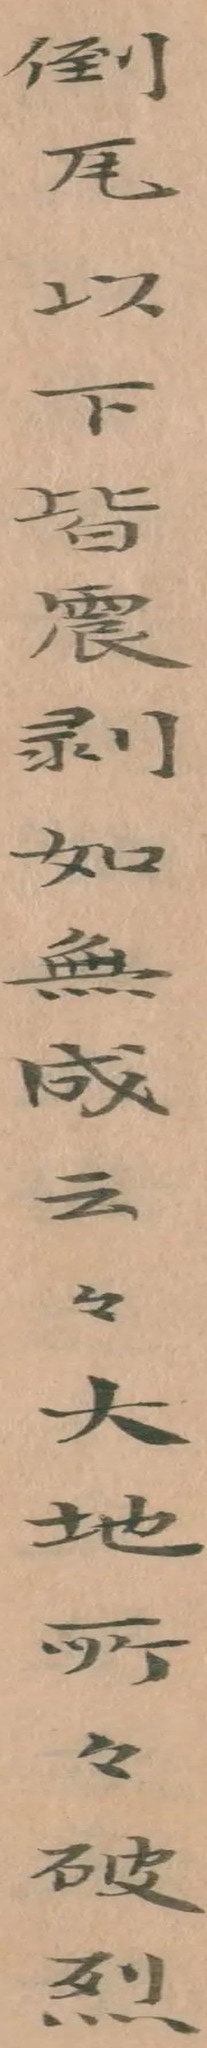倒瓦以下皆震剥如無成云々大地所々破烈
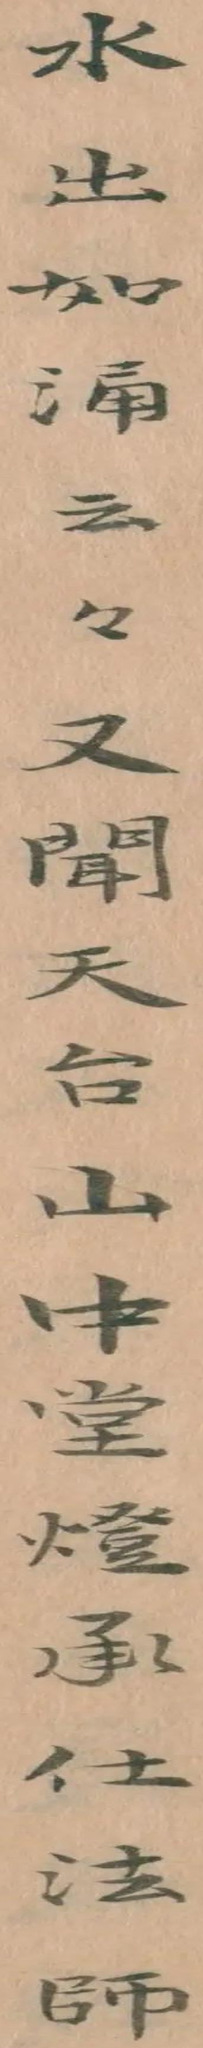水出如涌云々又聞天台山中堂燈承仕法師
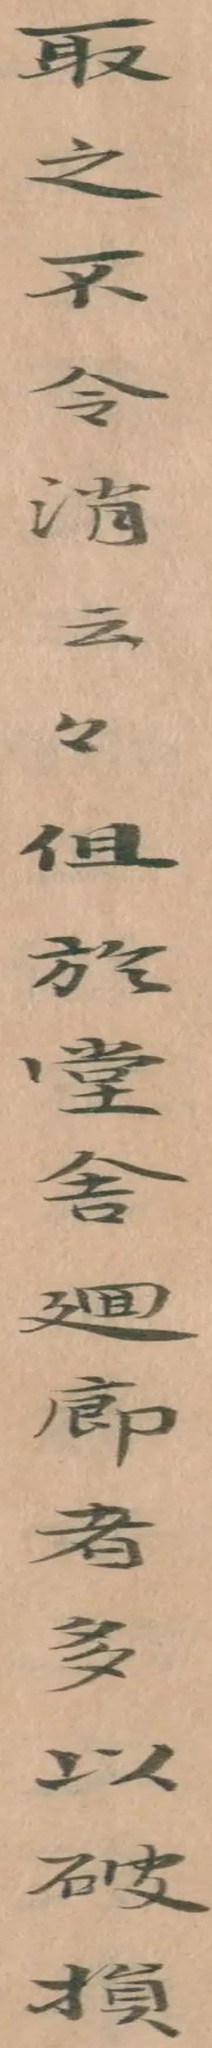取之不令消云々但於堂舎廻廊者多以破損
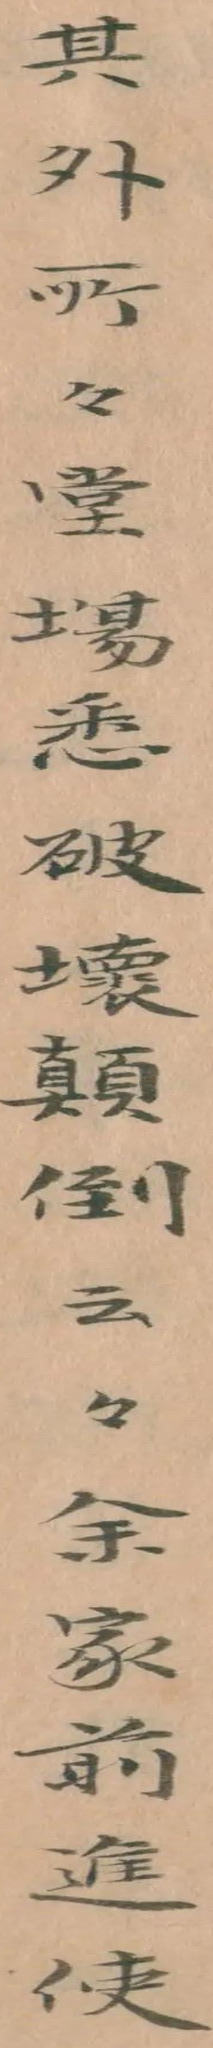其外所々堂場悉破壊顛倒云々余家前進使

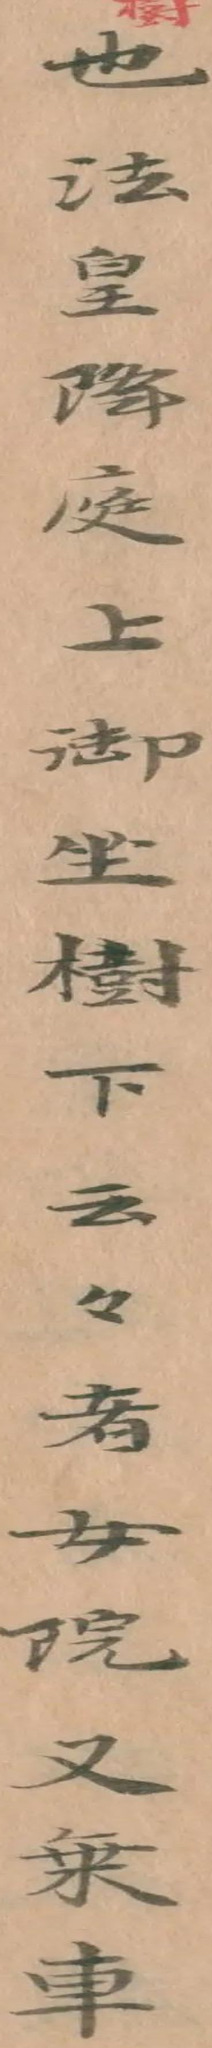也法皇降庭上御坐樹下云々者女院又乗車
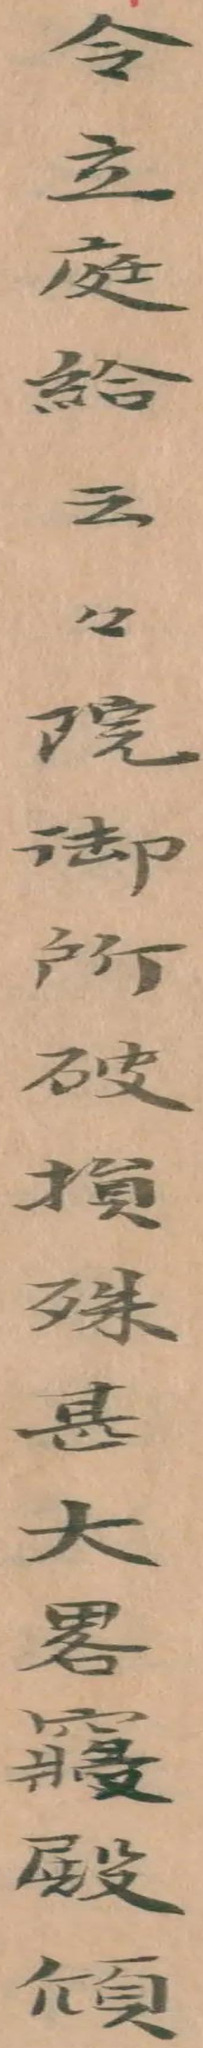令立庭給云々院御所破損殊甚大略寝殿傾
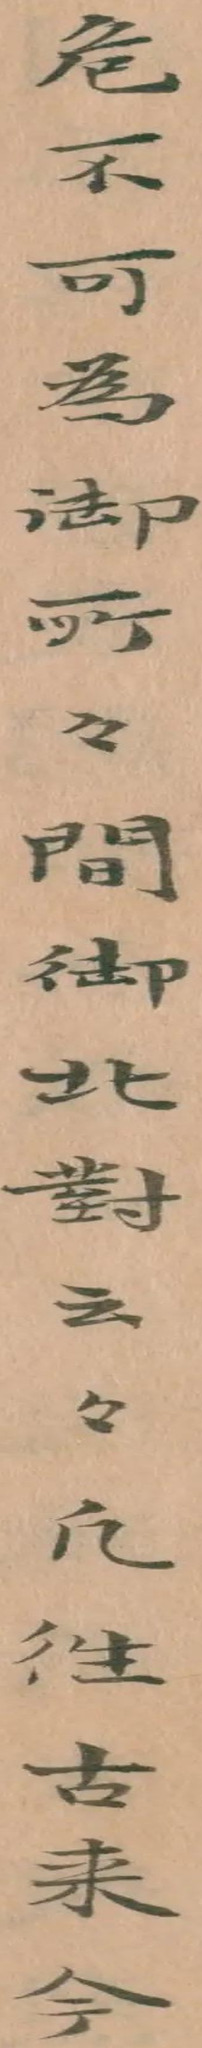危不可為御所々間御北対云々凡往古来今
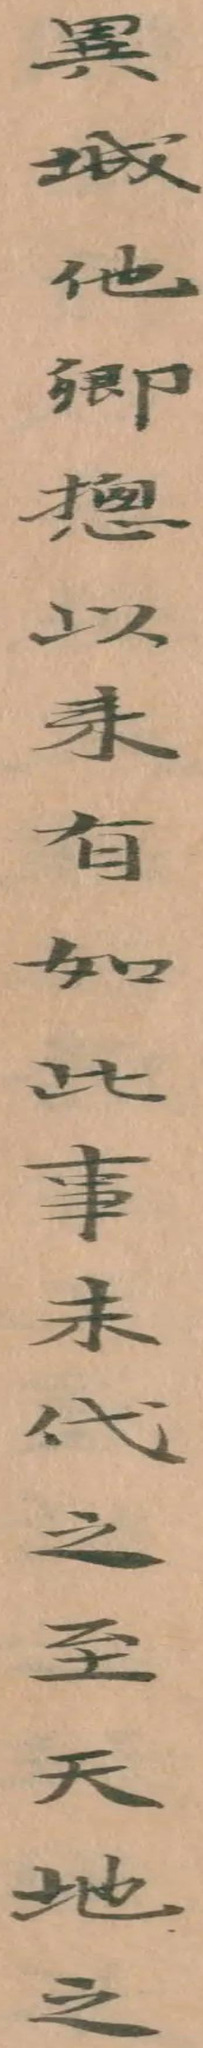異城他卿総以来有如此事末代之至天地之
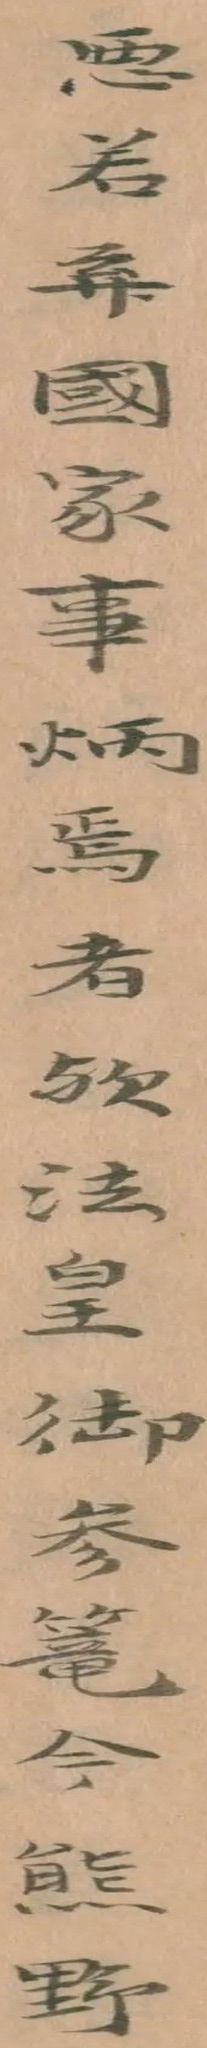悪若棄国家事炳焉者歟法皇御参籠今熊野
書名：地災撮要. 巻5-6(地震之部)
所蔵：国立国会図書館 National Diet Library, JAPAN
